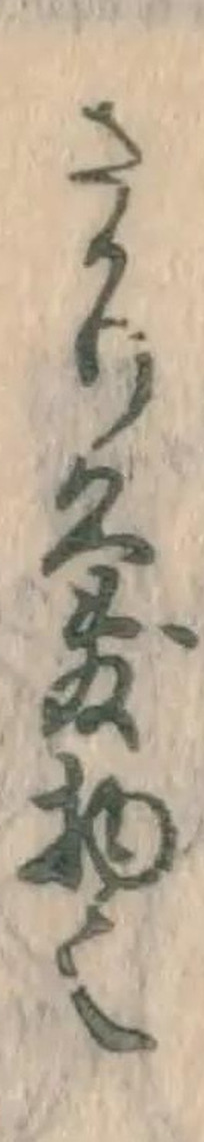さかり久敷物也
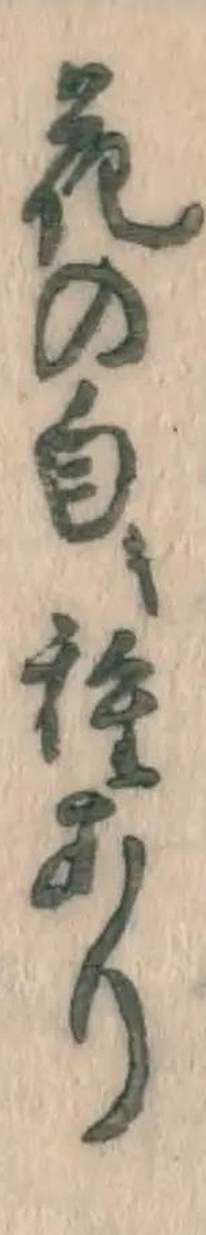花の白き種あり
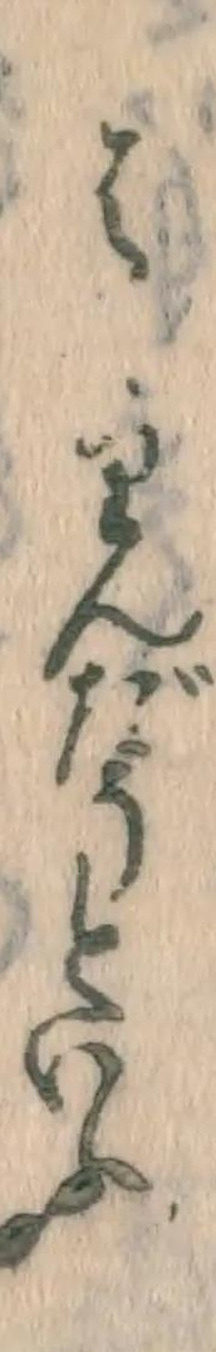はりんだうといふ
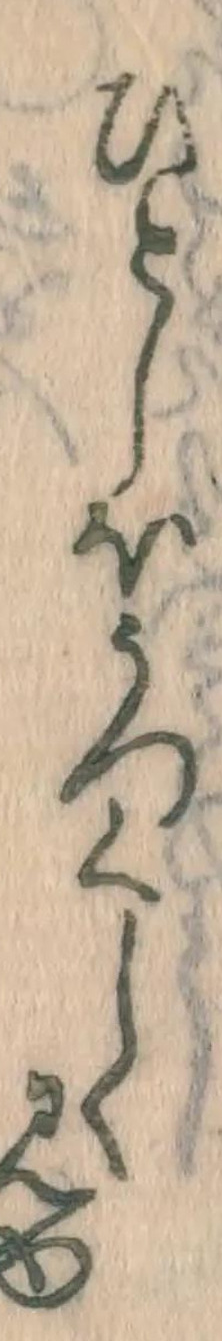ひとしほうつくしく見ゆ
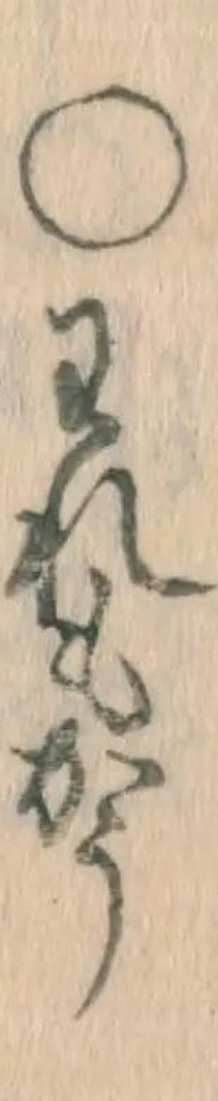〇われもかう
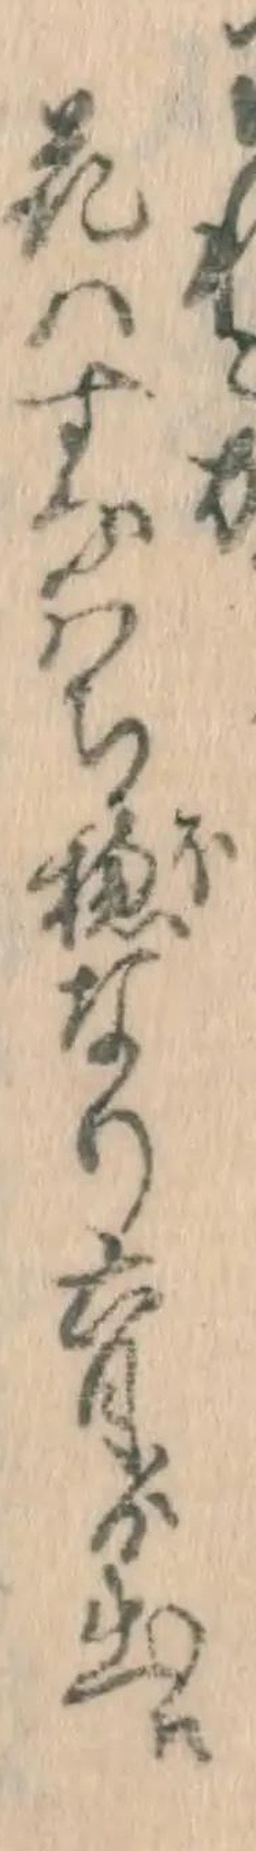花はすなはち穂なり六月ゟ出る

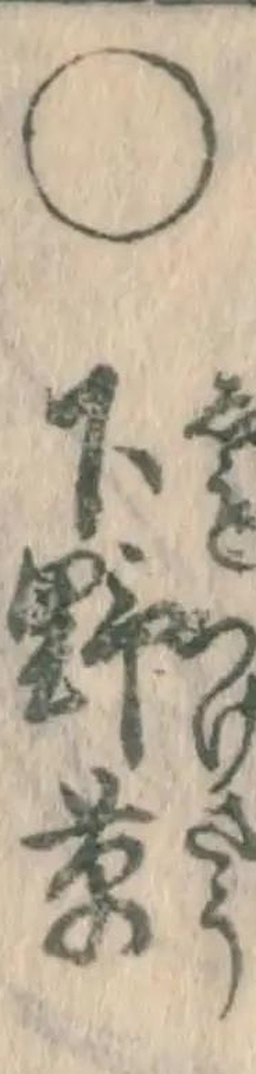〇下野草
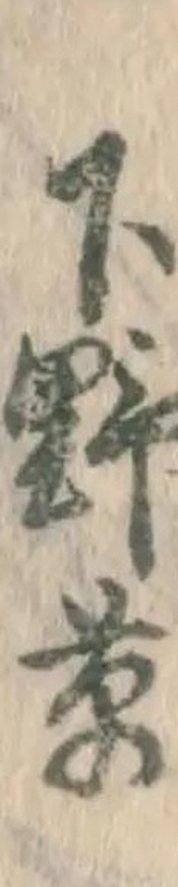〇下野草
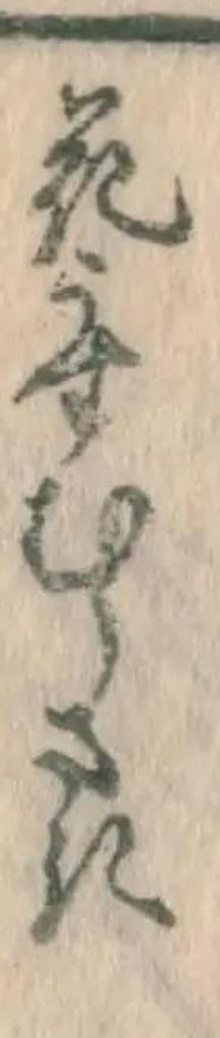花うすむらさき
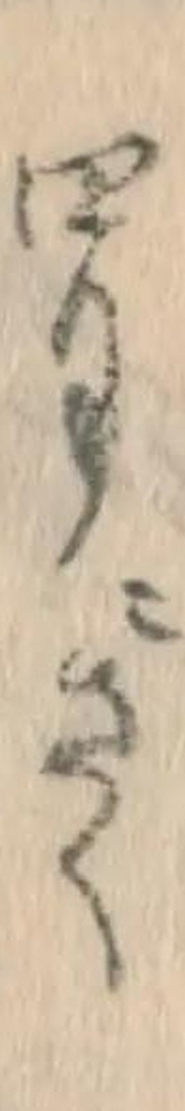四月にさく
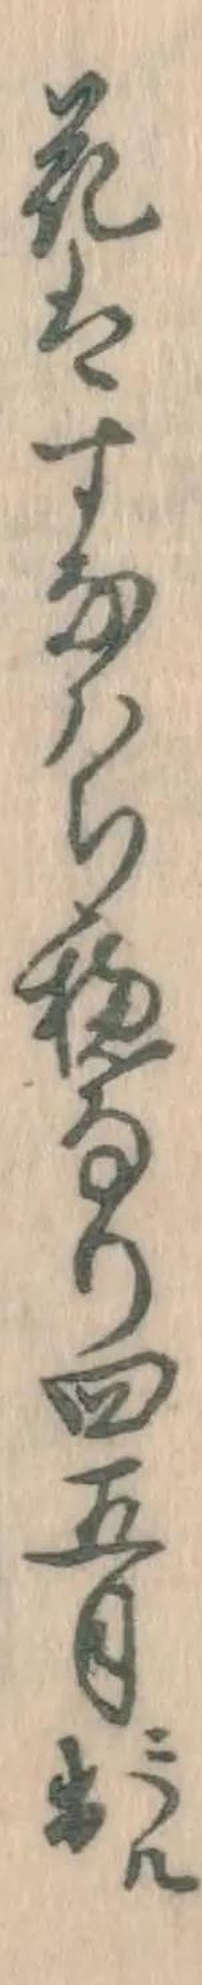花はすなはち穂なり四五月に出る
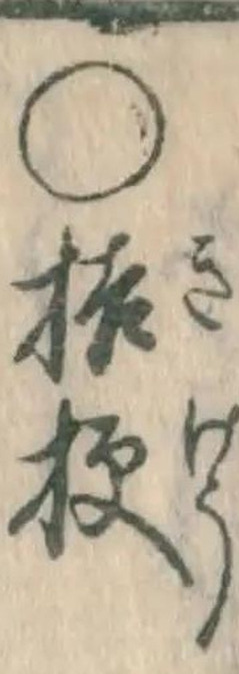〇桔梗
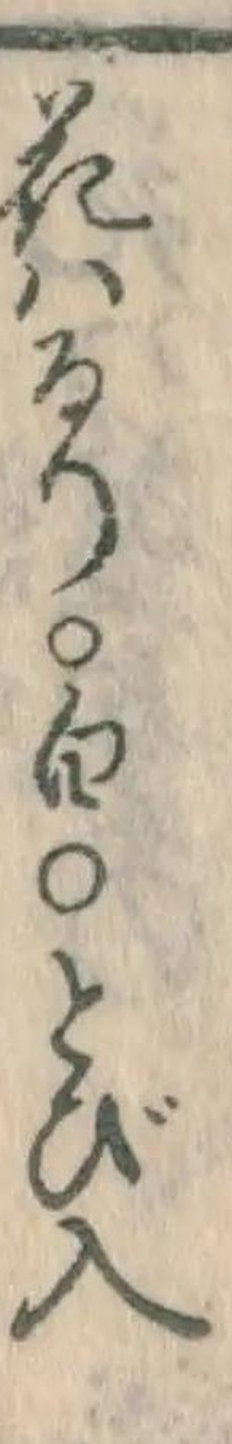花はるり〇白〇とび入
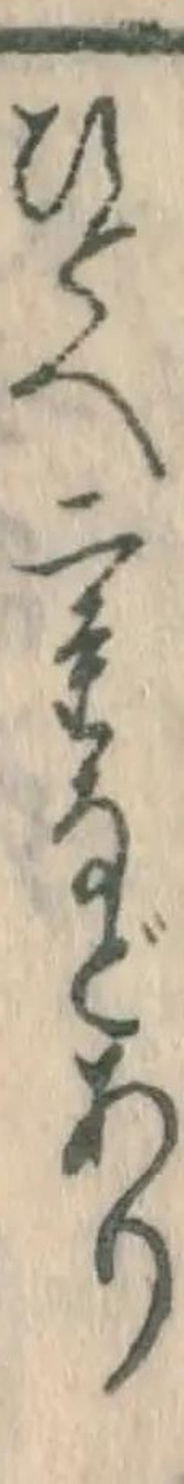ひとへ二重などあり
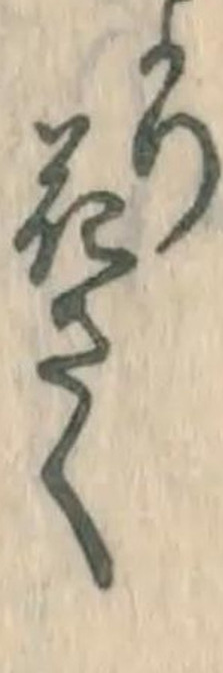花さく

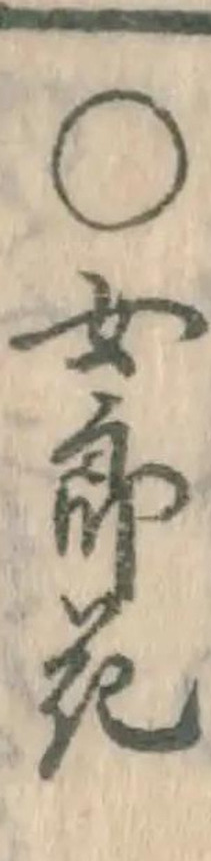〇女郎花
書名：艸花繪前集. [3]
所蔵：国立国会図書館 National Diet Library, JAPAN
